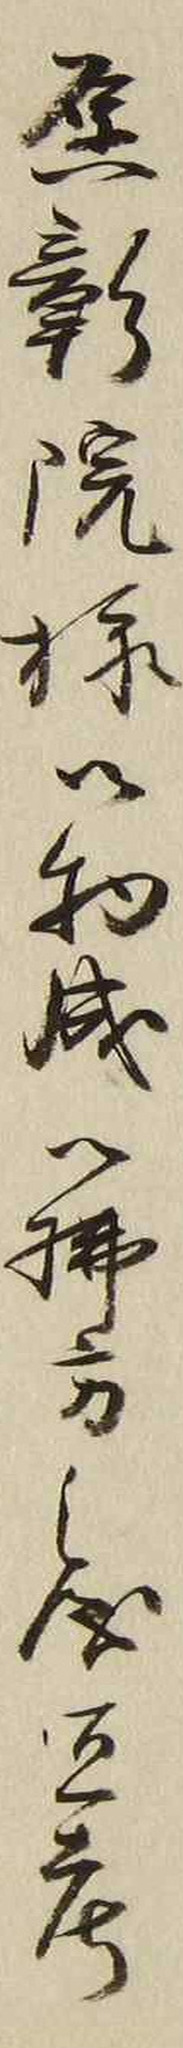愿彰院様御物成御払方之儀宜考
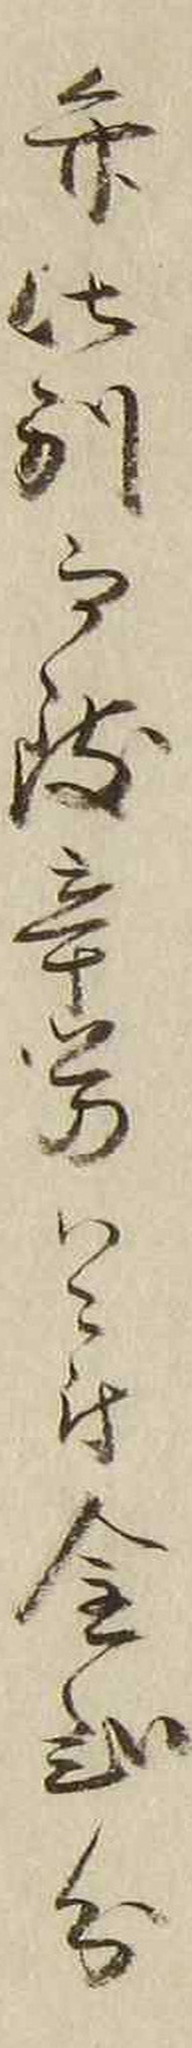弁仕別而致辛労候ニ付金弐分

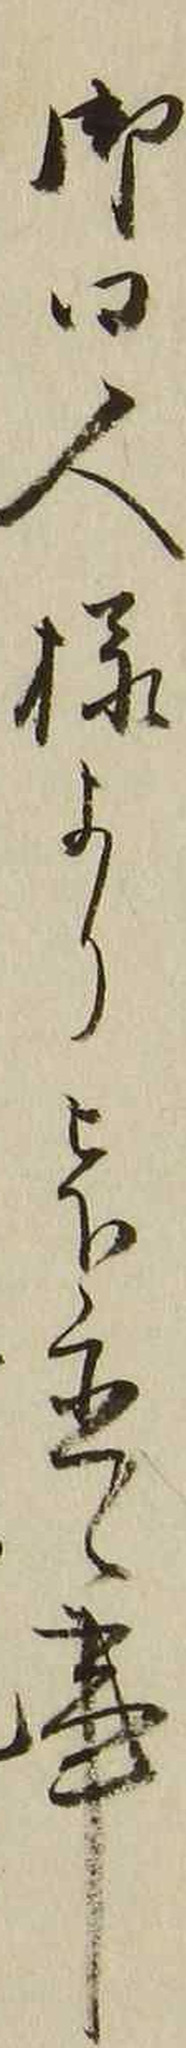御同人様より被下置候事
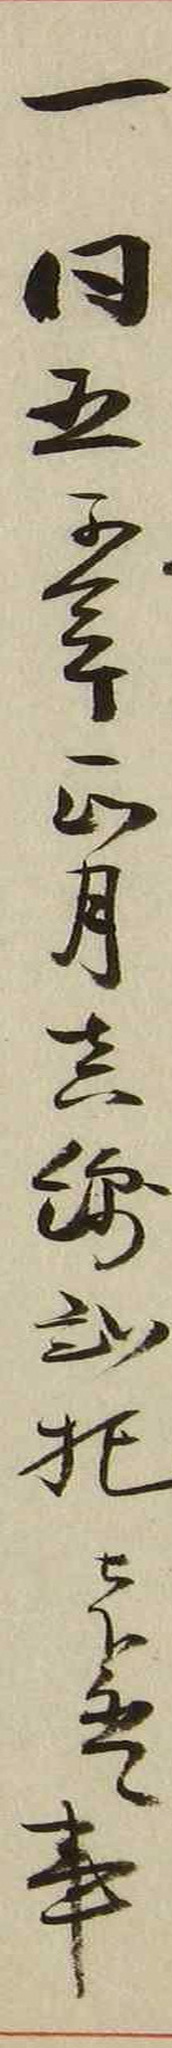一同五子年正月真綿弐把被下置候事
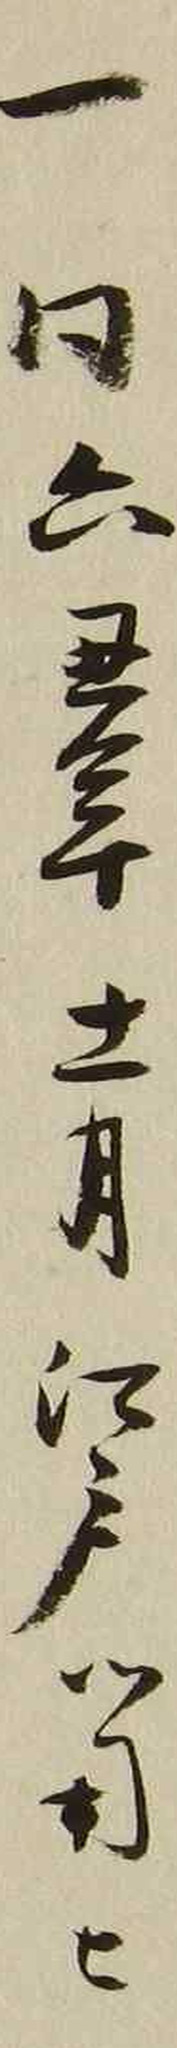一同六丑年十一月江戸御用被
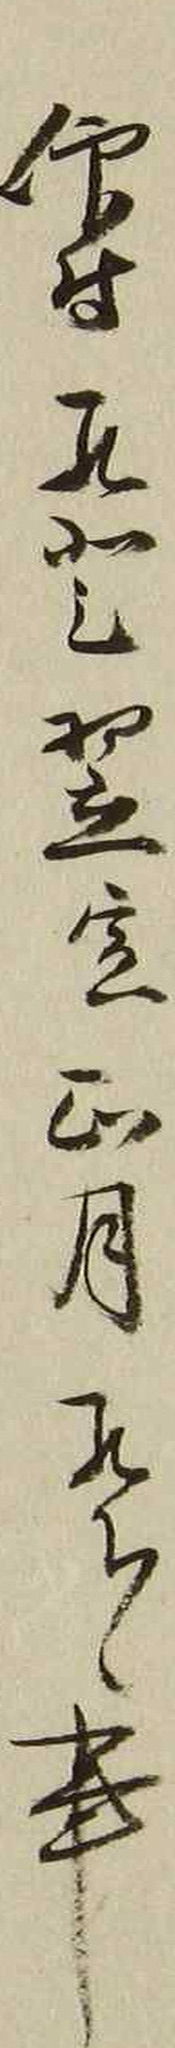仰付罷登翌寅正月罷下候事
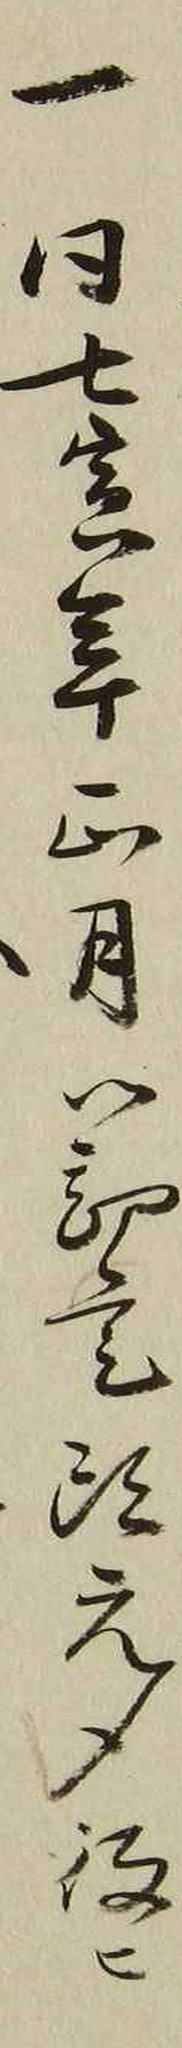一同七寅年正月御勘定頭元〆役被
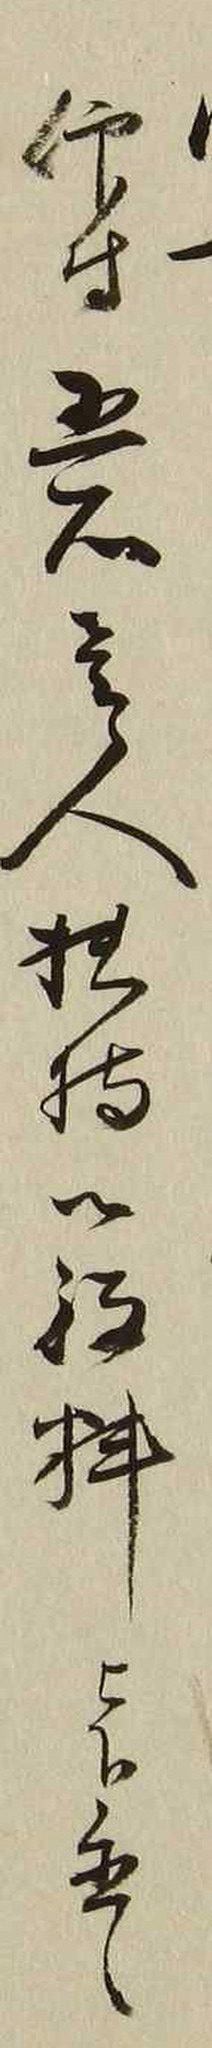仰付五石壱人扶持御役料被下置候
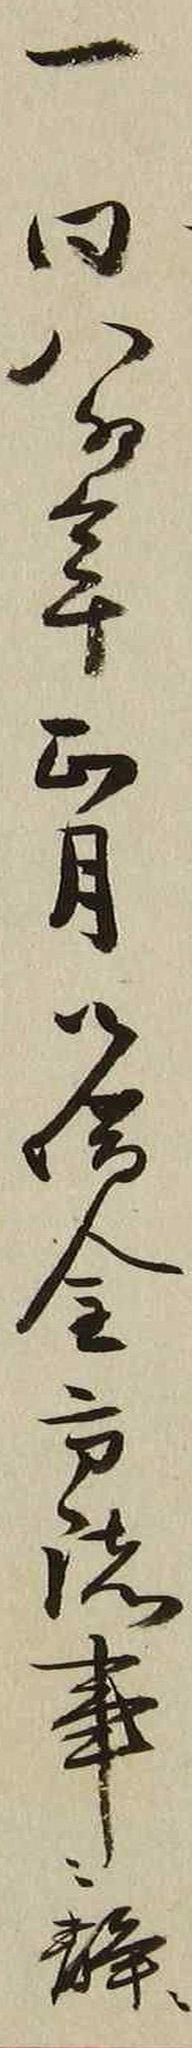一同八卯年正月御借金方諸事々静ニ
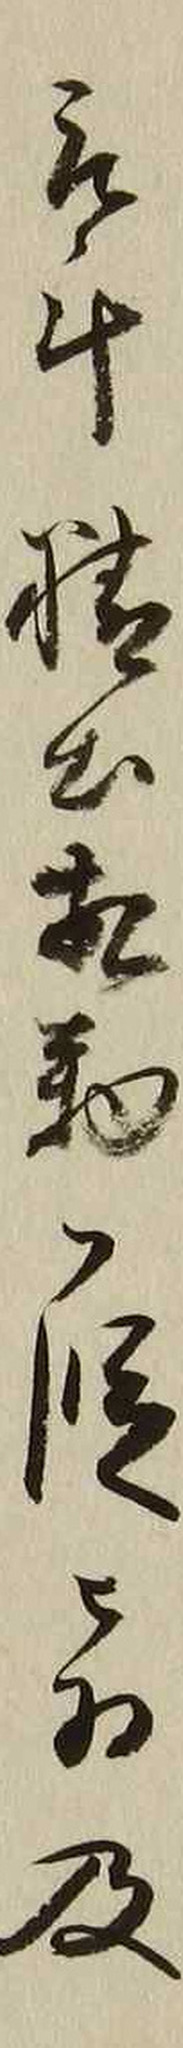取計精出相勤候段被為及
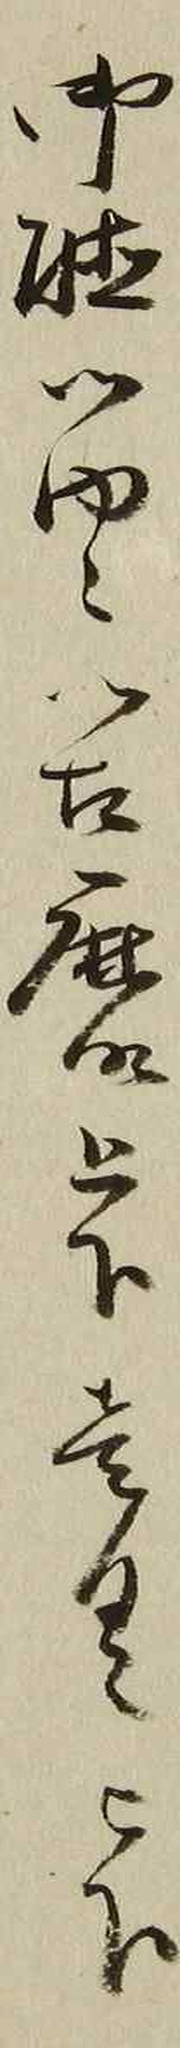御聴御内々御古麻御上下壱具被下
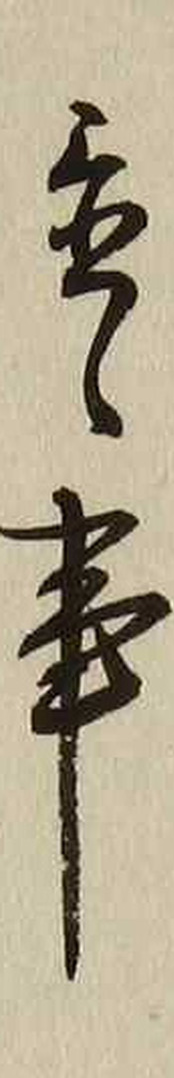置候事
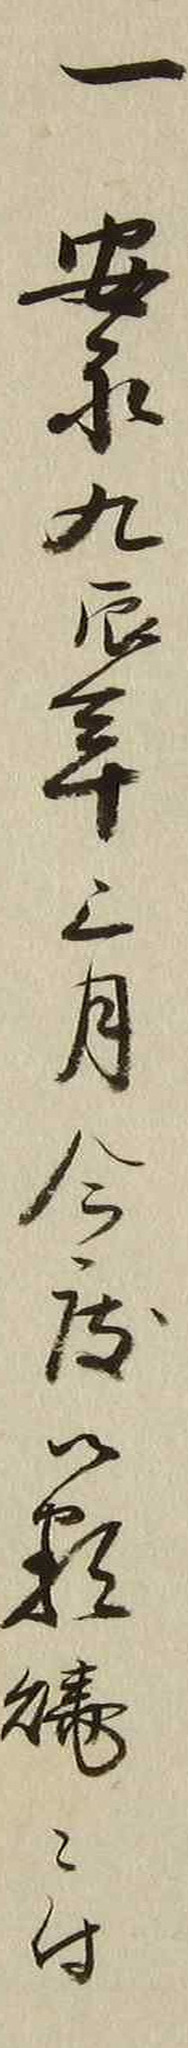一安永九辰年三月今度御類焼ニ付
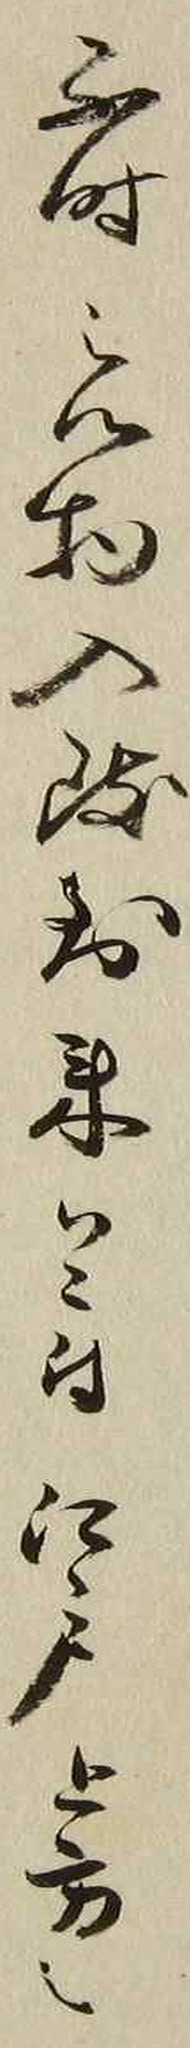不時之御物入致到来候ニ付江戸上方へ
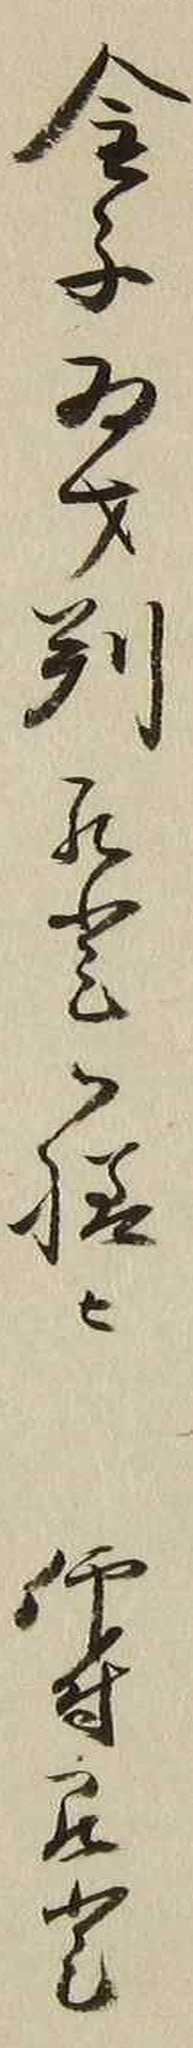金子為才判罷登候様被仰付罷登
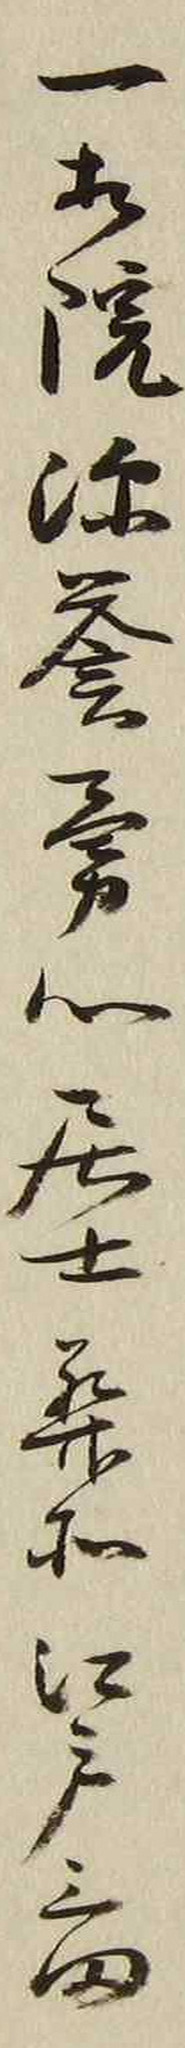一相院深誉勇心居士葬所江戸三田
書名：諸士系譜　巻之288　さ之部20
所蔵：会津若松市立会津図書館
